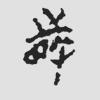{止日攴}
